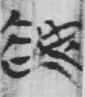欲
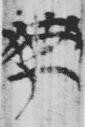{舛亼力}（勝）
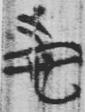志
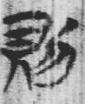則
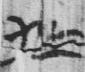喪
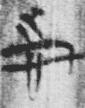志
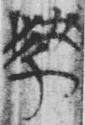○（勝）
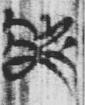欲
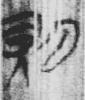則
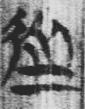從
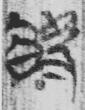欲
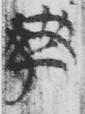○（勝）
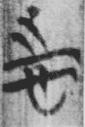志
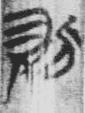則
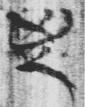兇
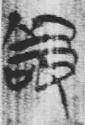敬
